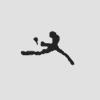又
